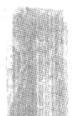剛
